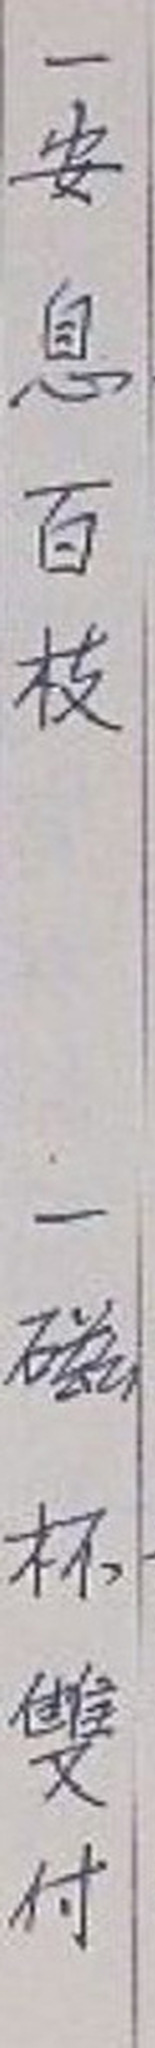一安息百枝一磁杯雙付
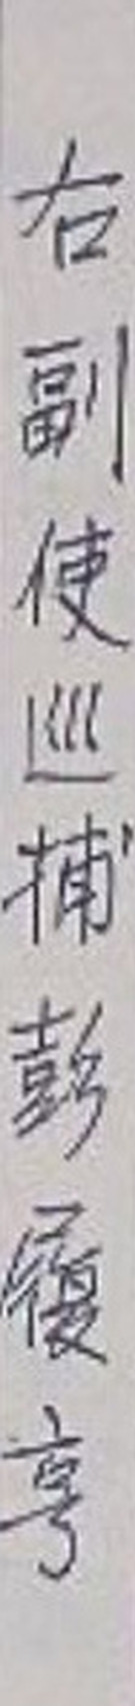右副使巡捕彭履亨
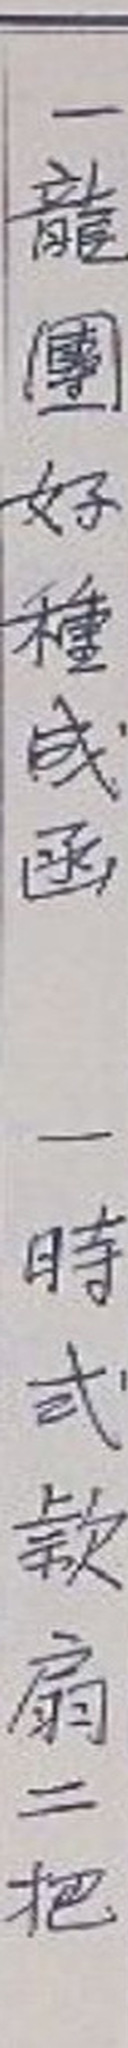一龍団好種成函一時式款扇二把
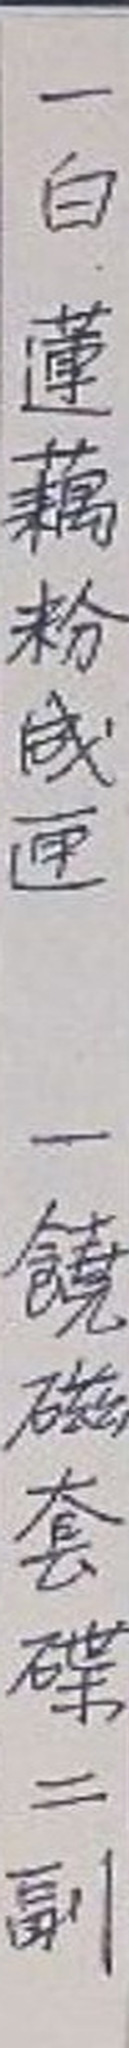一白蓮藕粉成匣一饒磁套碟二副
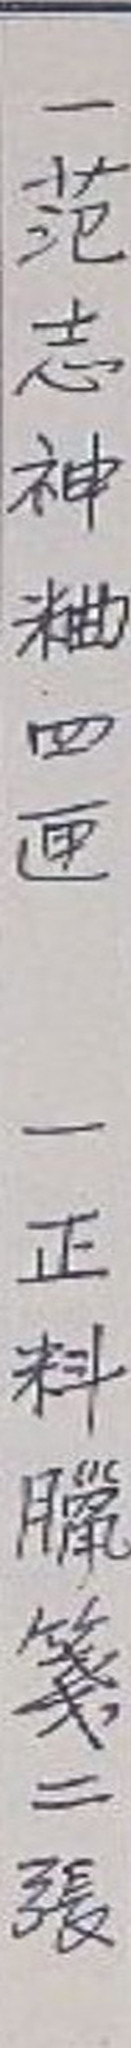一范志神粬四匣一正料臘箋二張
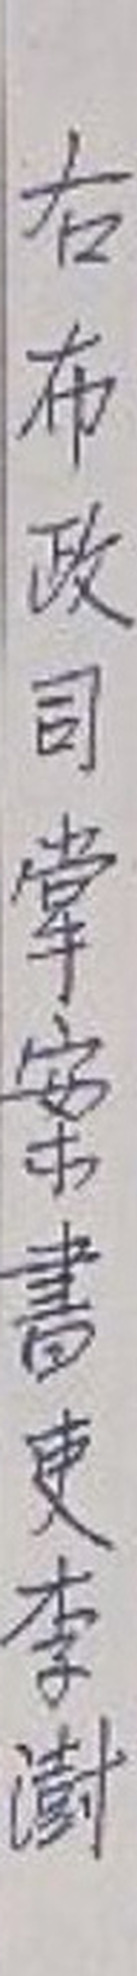右布政司掌案書吏李澍
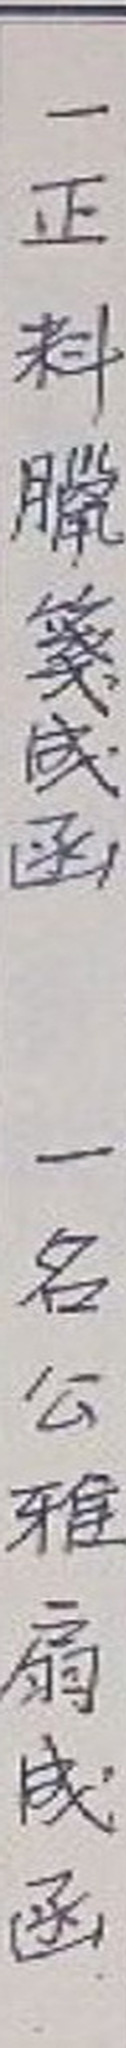一正料臘箋成函一名公雅扇成函
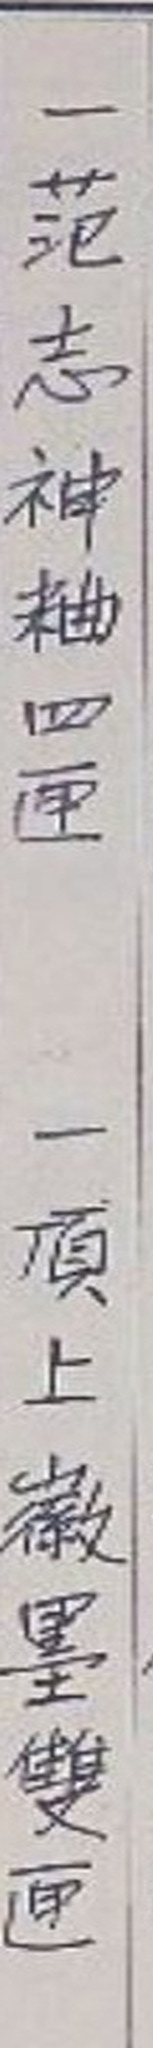一范志神粬四匣一頂上徽墨雙匣
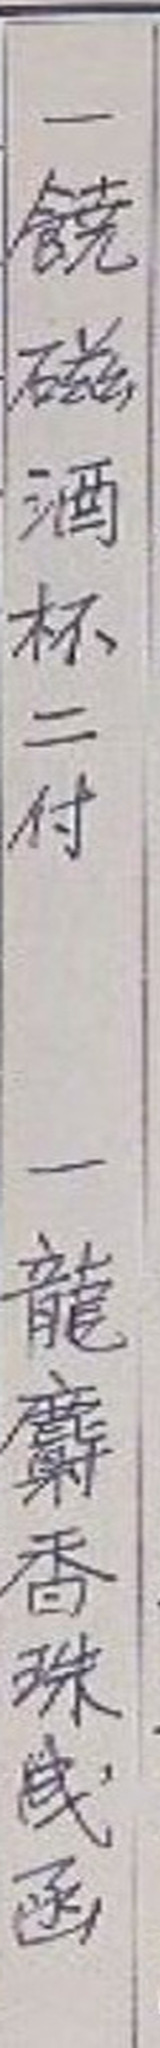一饒磁酒杯二付一龍麝香珠成函
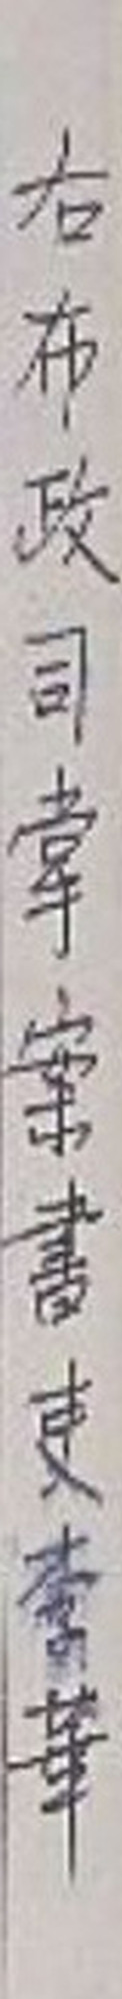右布政司掌案書吏李華
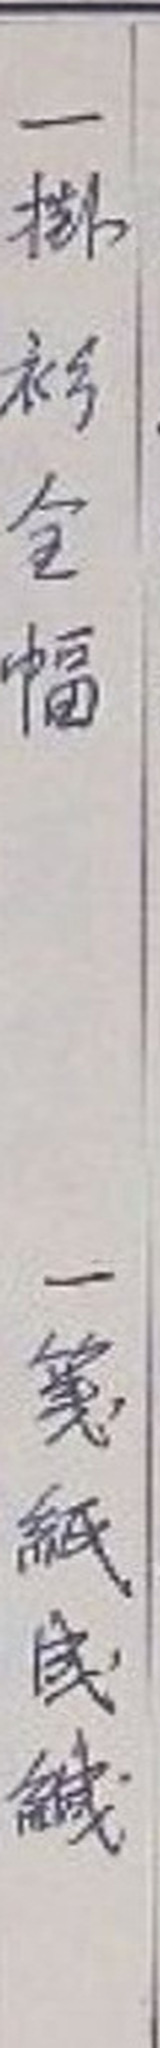一掛衫全幅一箋紙成緘
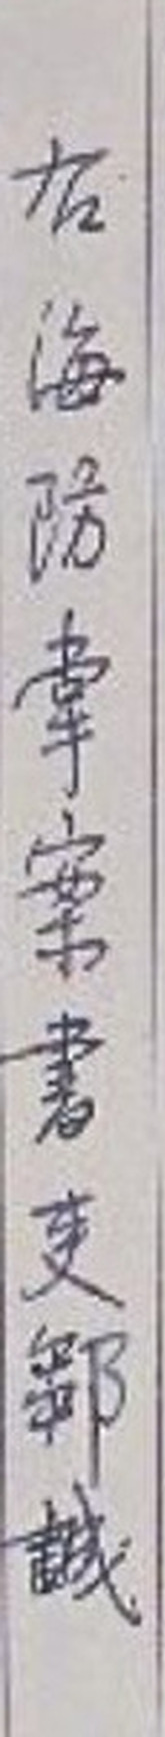右海防掌案書吏鄒誠
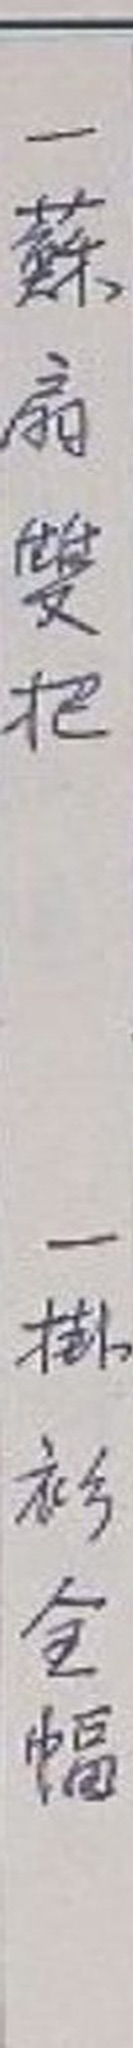一蘇扇雙把一掛衫全幅
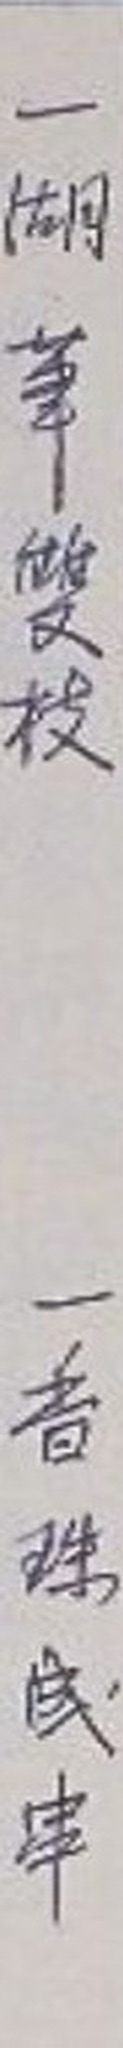一湖筆雙枝一香珠成串
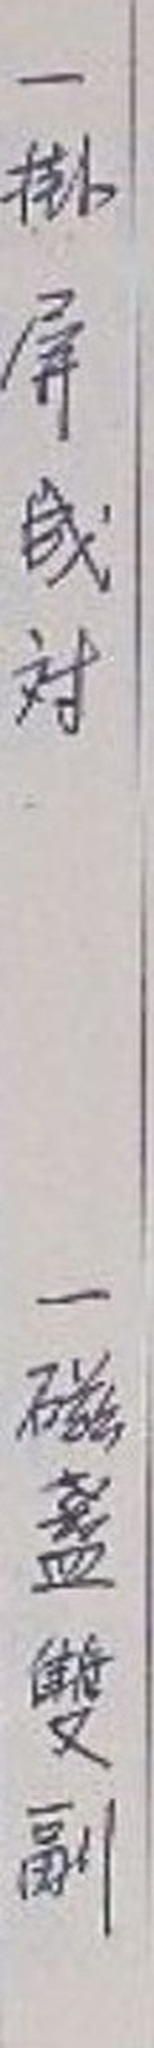一掛屏成対一磁盞雙副
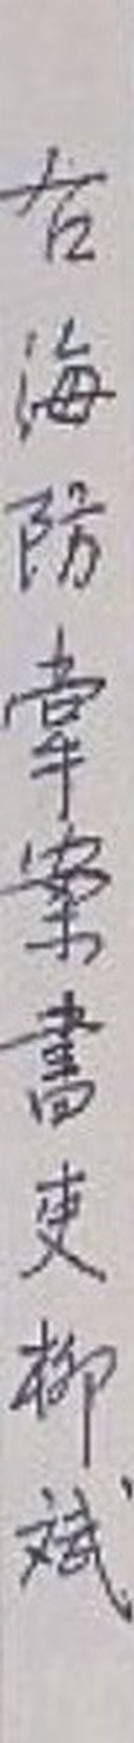右海防掌案書吏柳斌
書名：支那冊封使来琉諸記 下巻
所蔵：University of the Ryukyus Library
